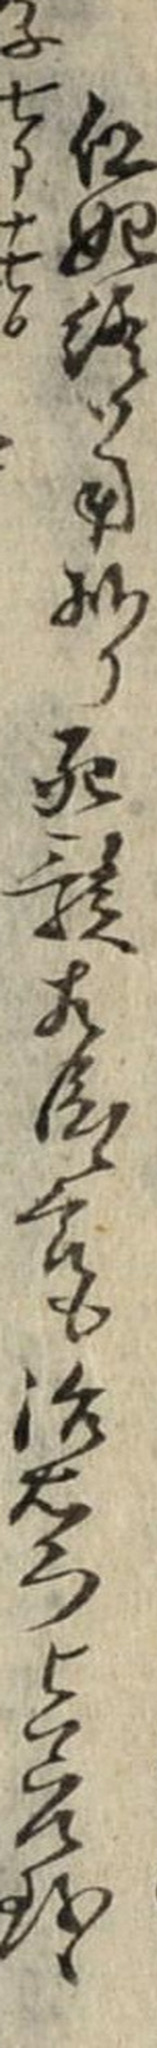但始終御用掛り死骸相渡候節も治右衛門被差越候
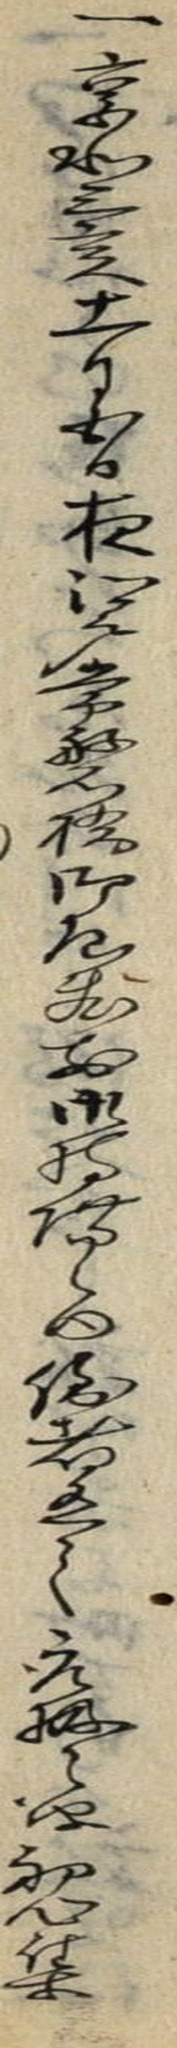一享和三亥十一月五日夜江戸常盤橋御屋敷前御持場之内倒者有之取扱之儀初心集
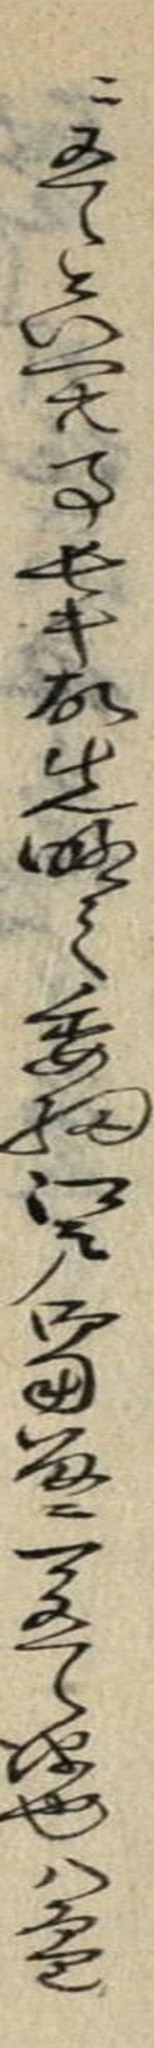に有之といへ共事長き故先略之委細江戸御用留に可有之儀也八百里
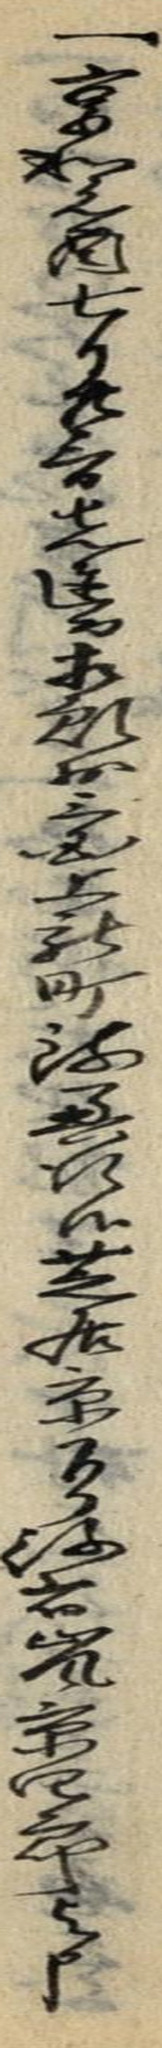一享和元酉七月廿三日先達而相願於三国上新町致興行候芝居京下り役者嵐京四郎と申
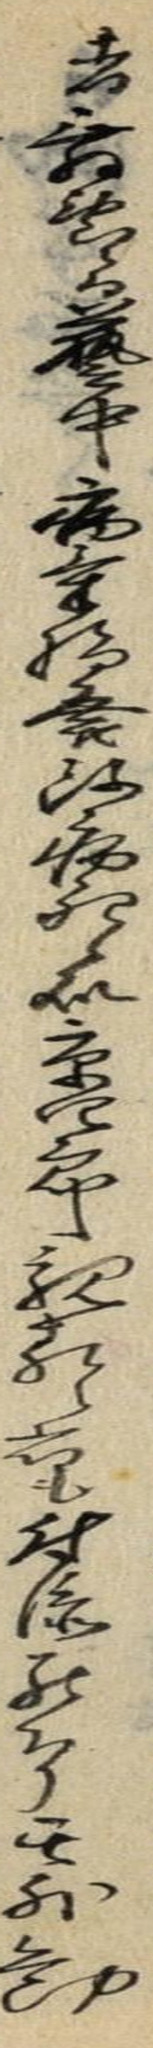者舞台に而芸中病気指発致病死候処京四郎親類之者も付添罷下り其外勧
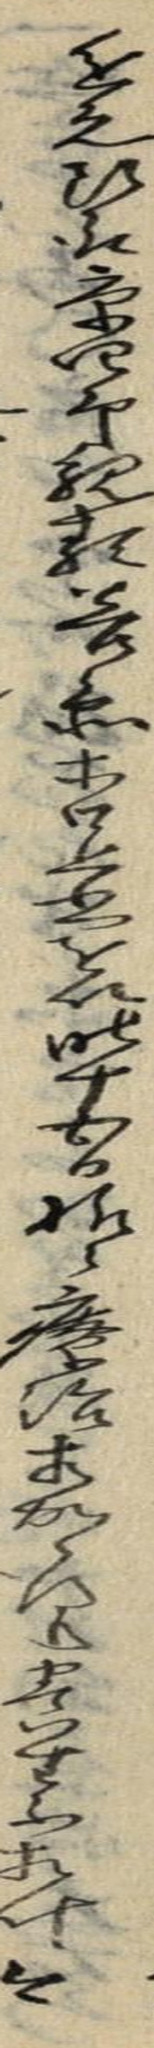進元頭取京四郎親類善兵衛等口上書を以昨十五日様々療治相加候得共養生不相叶今
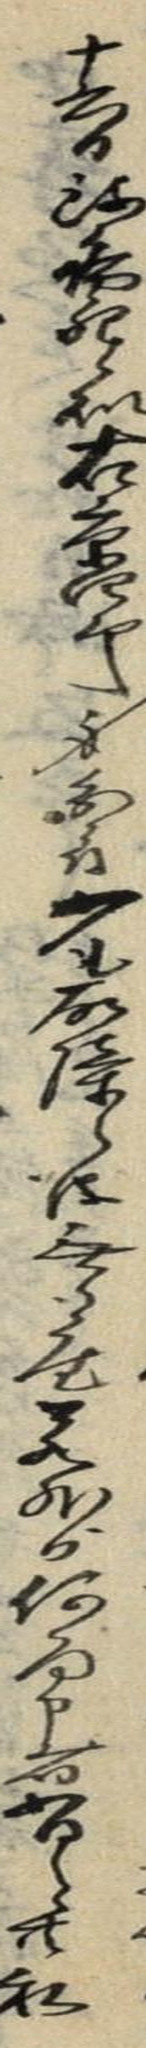十六日致病死候処右京四郎身分に付少も故障之儀無御座若外ゟ何角申者有之候共私
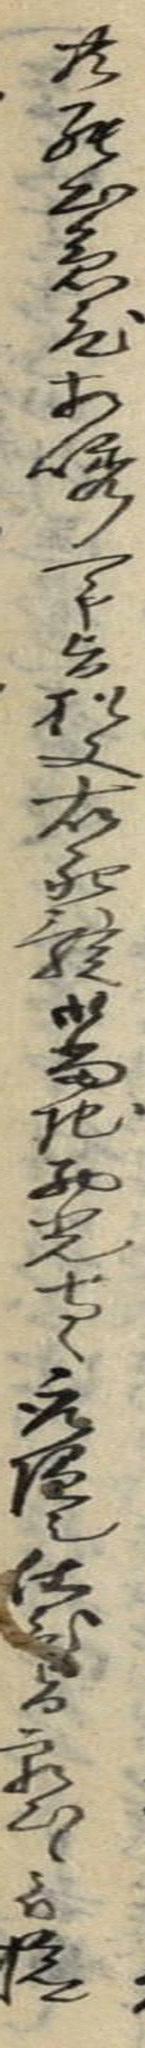共罷出急度相唀可申旨猶又死骸御当地西光寺へ取隠し仕度旨願出候に付検
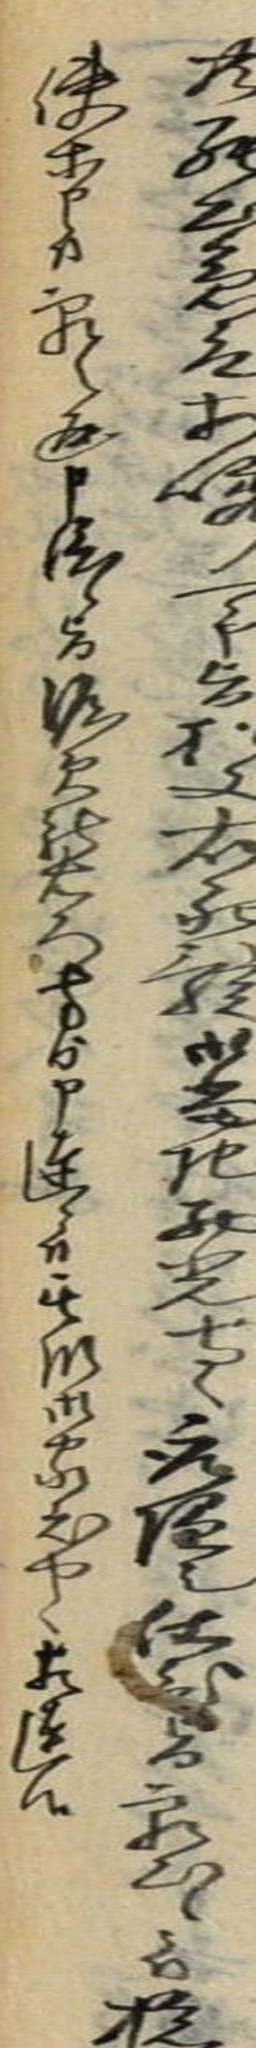使等申付願之通申渡候旨渥美新右衛門方ゟ申達候に付其段御家老中へ相達候
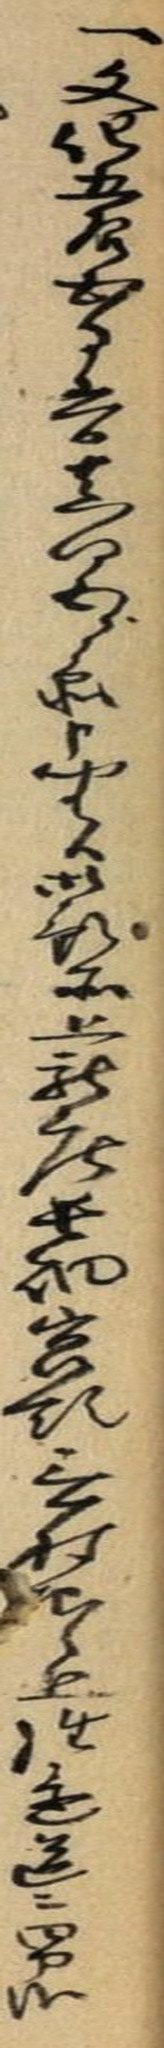一文化五辰五月六日真田五郎兵衛申聞候は御預所上新庄長畑宮領三ケ村地之上往還道に男弐
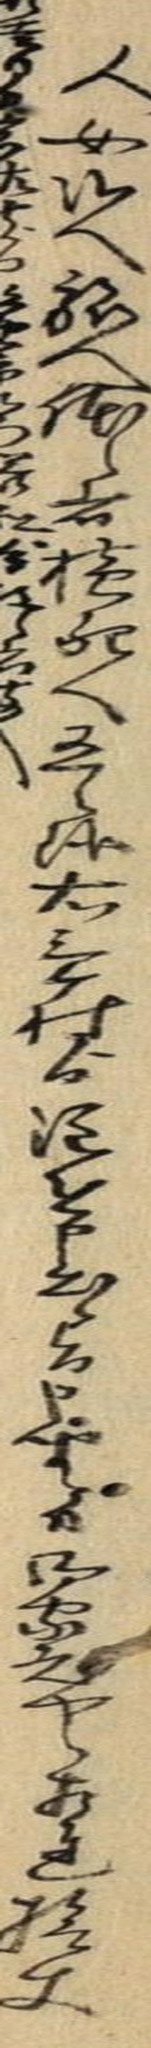人女弐人旅人体之者横死人有之趣右三ケ村ゟ注進申出候旨申聞候に付御家老中へ相達検使
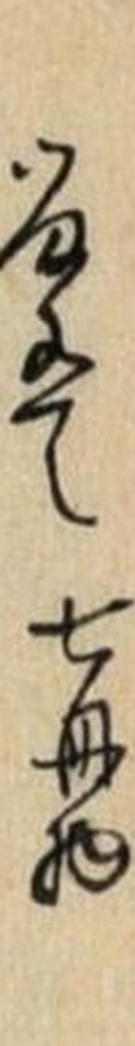留有之七冊物
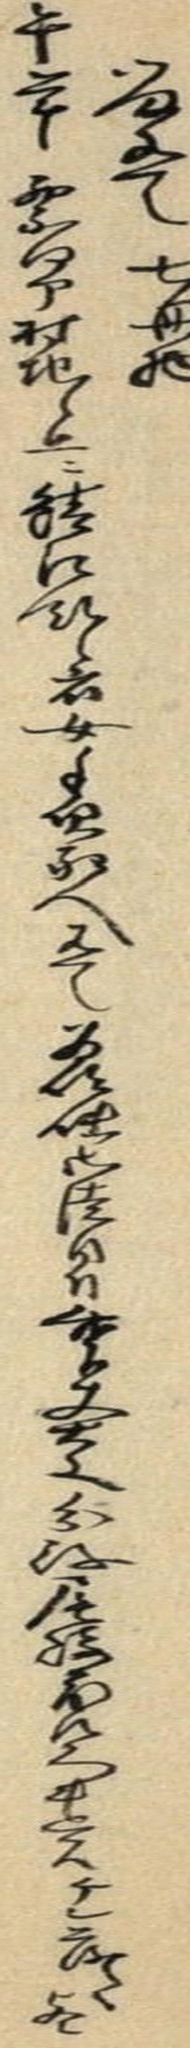一天保五午年粟田部村地之上に鯖江領之者女手負死人有之為吟味御徒目付竹下丈大夫分役尾崎茂左衛門遣すケシ落候歟
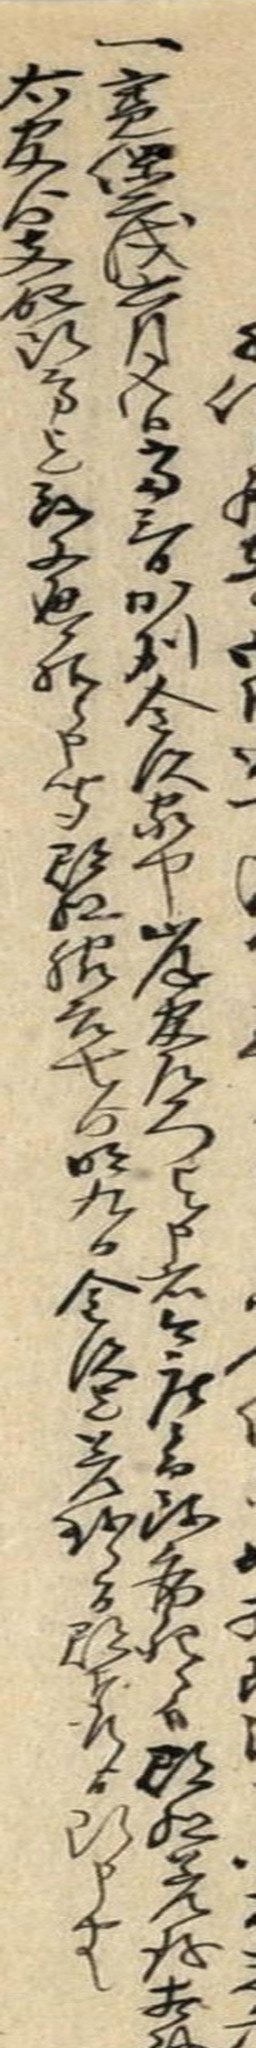右官左衛門支配頭方迄致文通候様被申聞郡組脇谷七右衛門昨九日金沢迄差越候旨郡奉行ゟ断申聞候

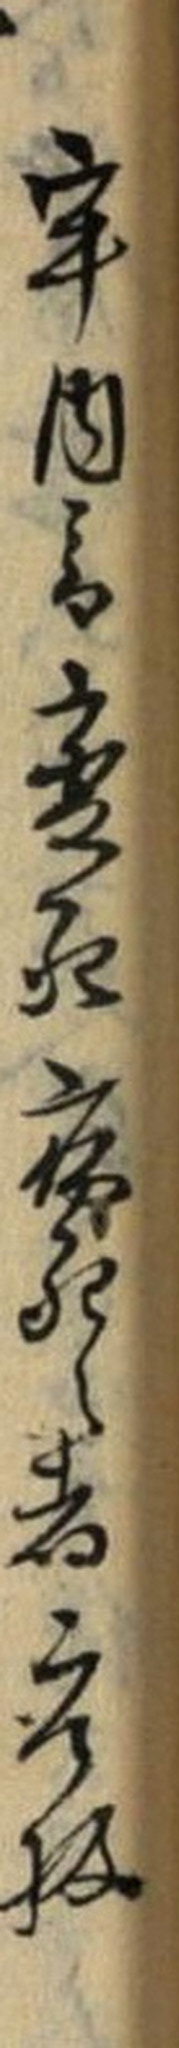牢内にて変死病死之者取扱
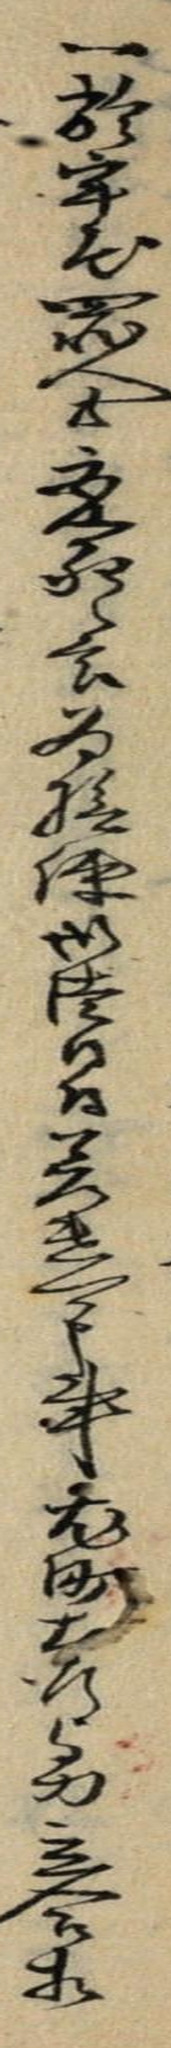一於牢屋罪人共変死之節為検使御徒目付差遣可申事尤町奉行与力立合相
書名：御停止異変死失
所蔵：福井県文書館 Fukui Prefectural Archives
